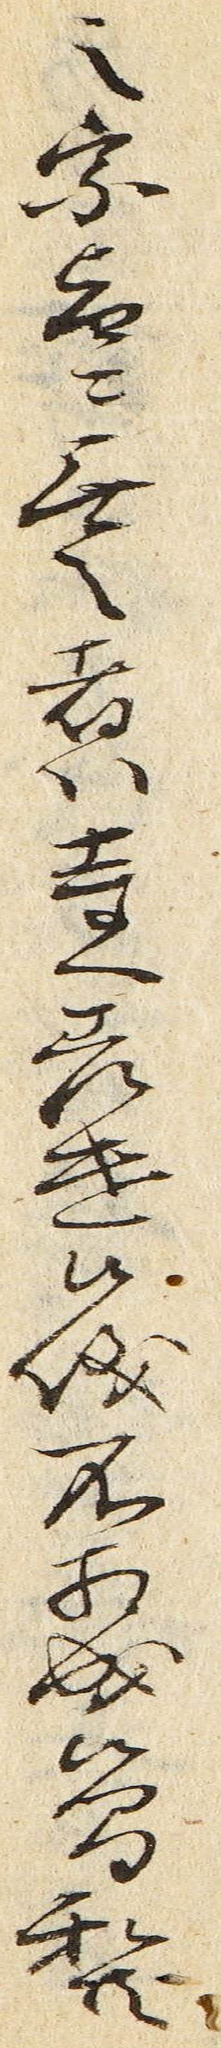之宗旨に無之者は寺へ差遣候儀不相成候間私共

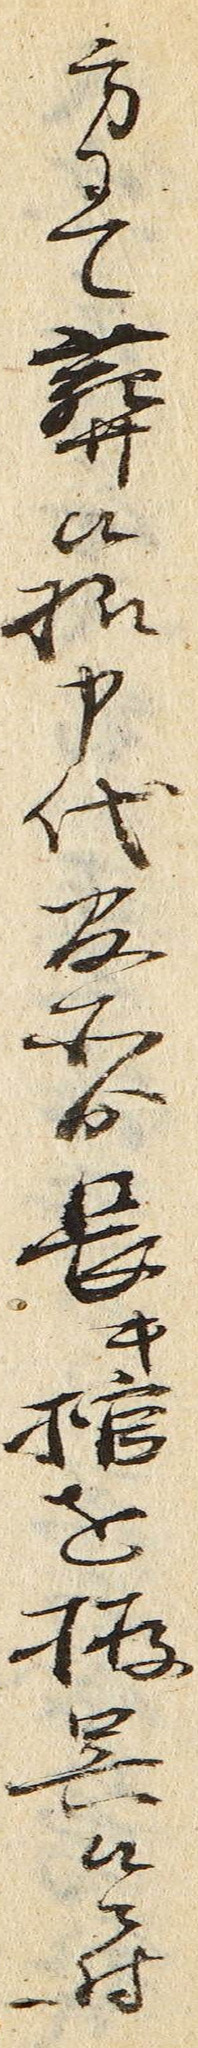方にて葬候様申代官所ゟ長キ棺を拵呉候に付
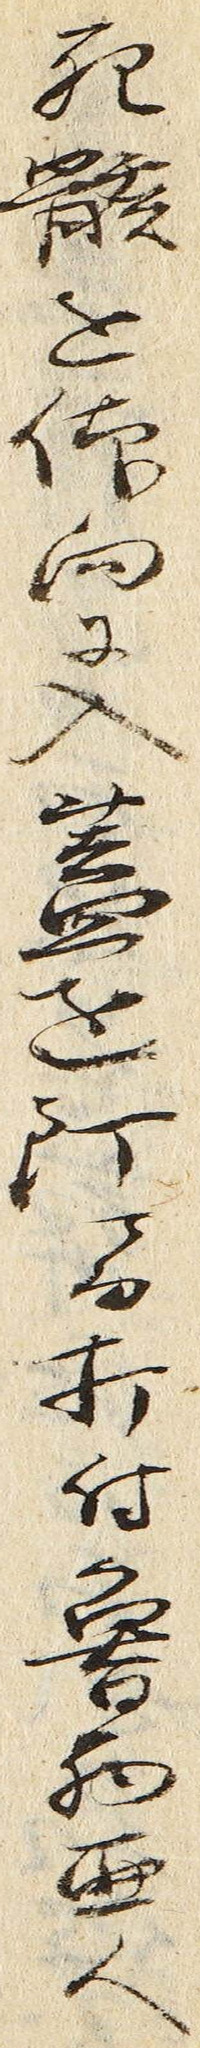死骸を仰向に入蓋を釘にて打付魯西亜人
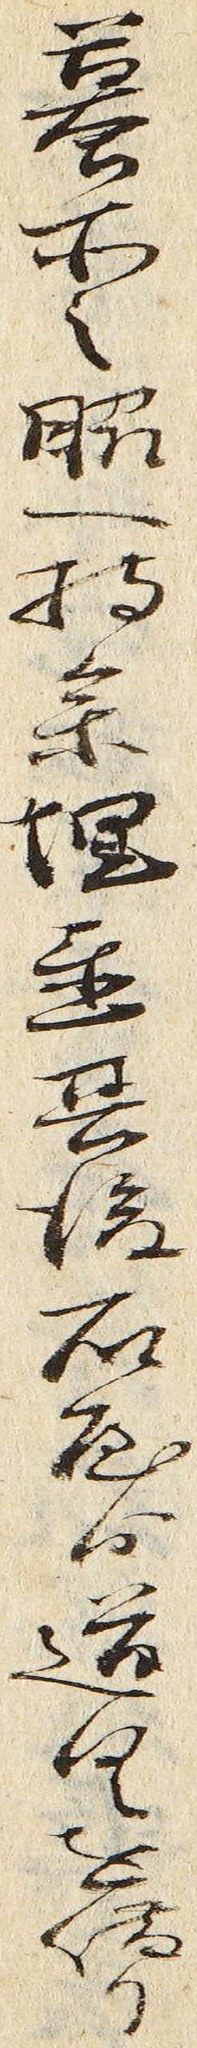墓所之脇へ持参埋置其後石屋ゟ道具を借り
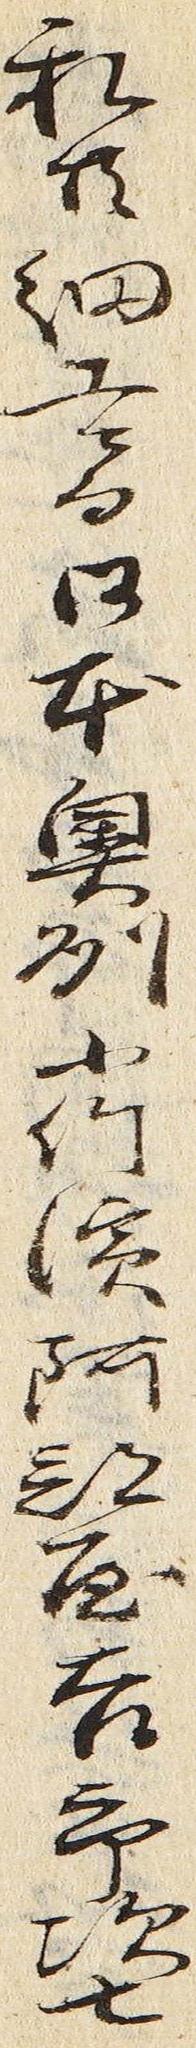私共細工にて日本奥州小竹浜阿部屋吉郎次七
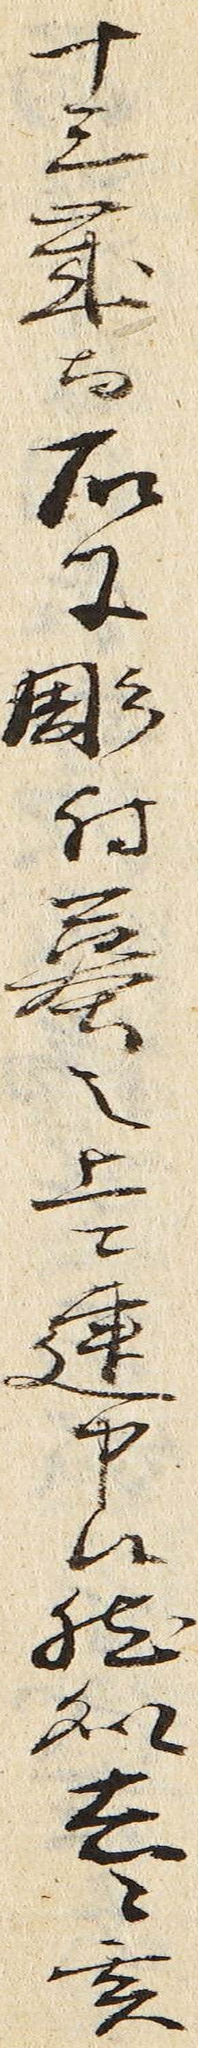十三歳と石に彫付墓之上に建申候然処去々亥
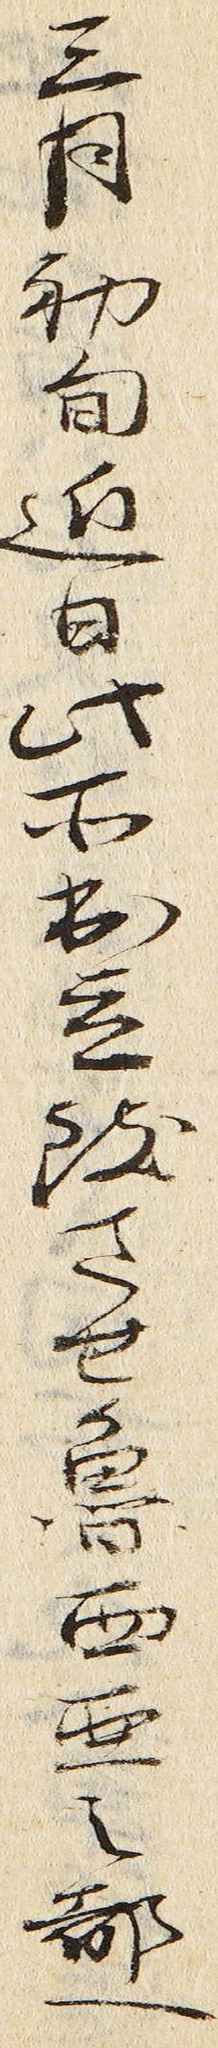三月初旬近日此所出立致させ魯西亜之都へ
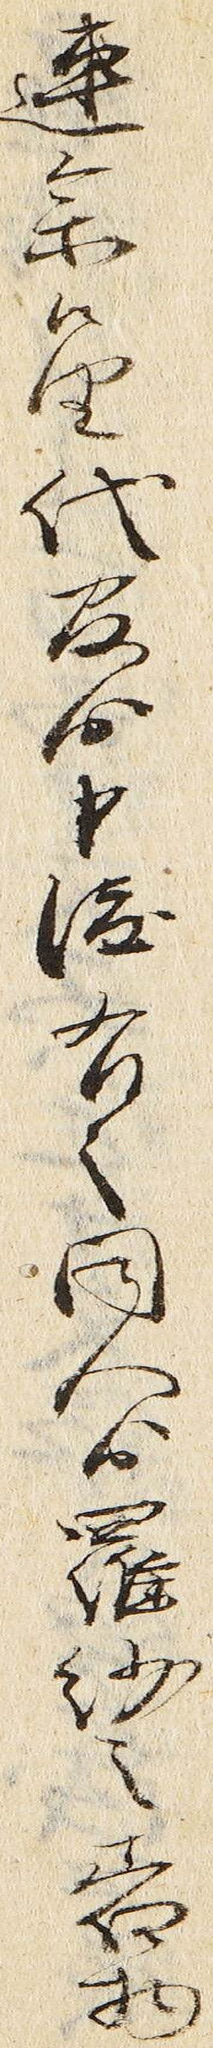連参候由代官ゟ申渡有之同人ゟ羅紗之着物
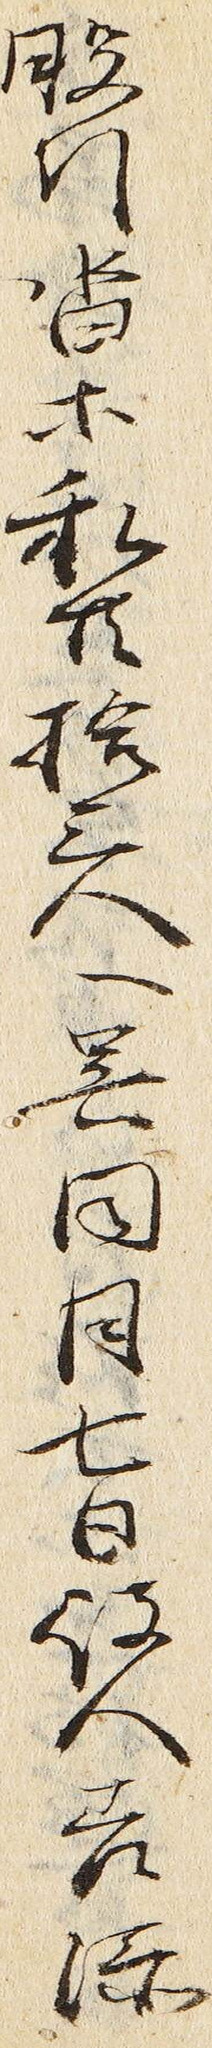股引沓等私共拾三人へ呉同月七日役人差添
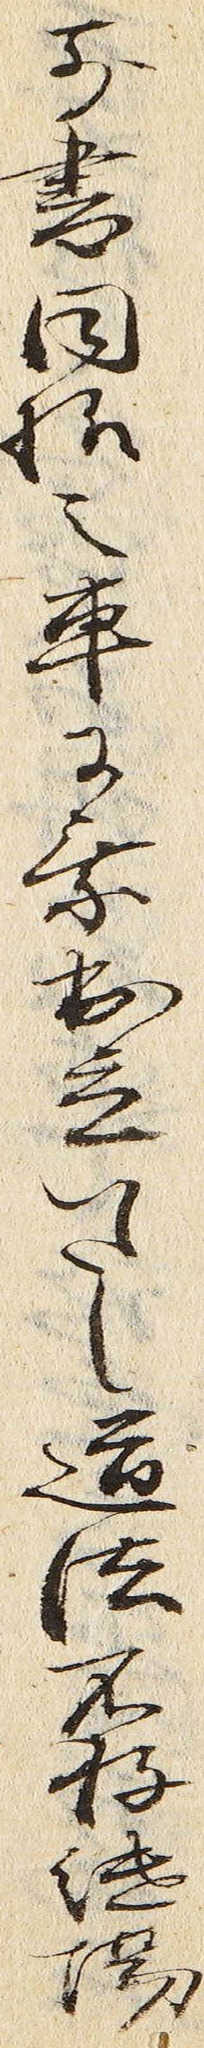前書同様之車に乗出立いたし道法不存継場
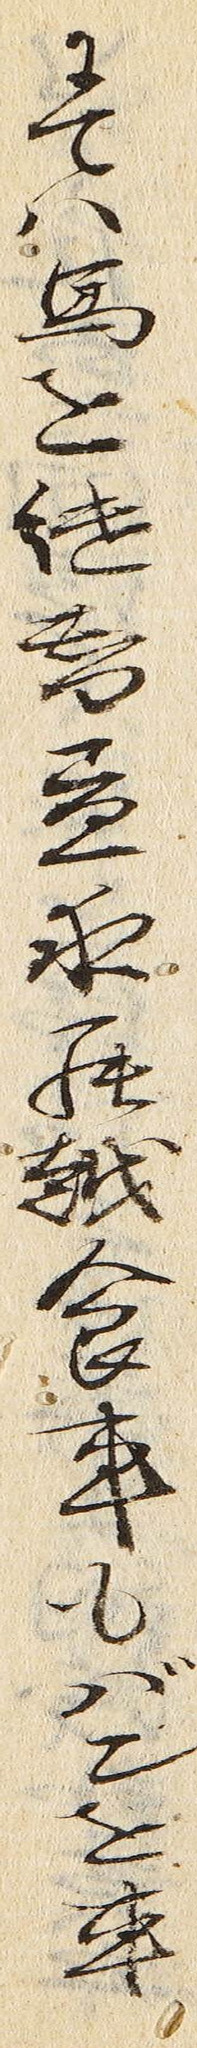にては馬を継替昼夜罷越食事もバンを車
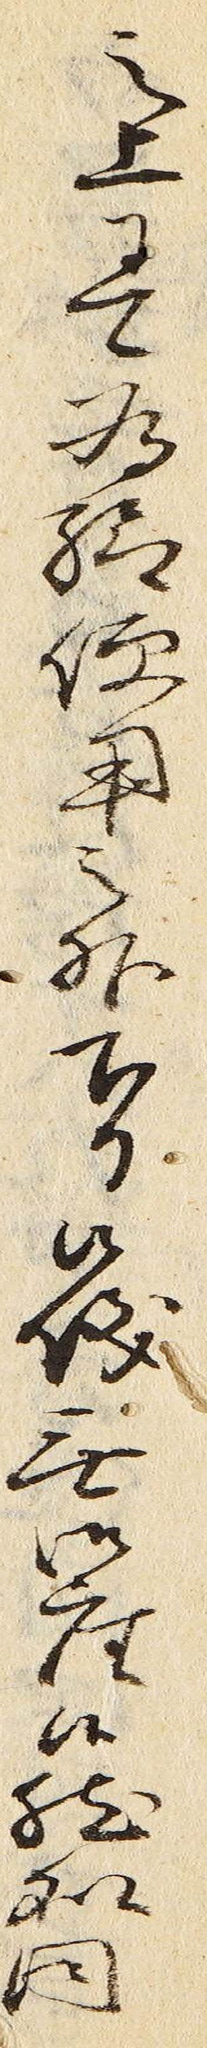之上にて為給便用之外下り候儀無御座候然処同
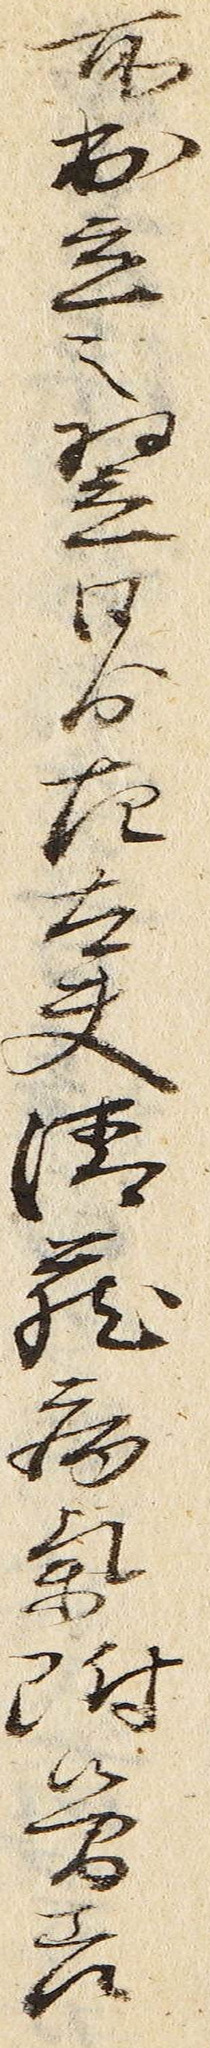所出立之翌日ゟ左太夫清蔵病気附候間差
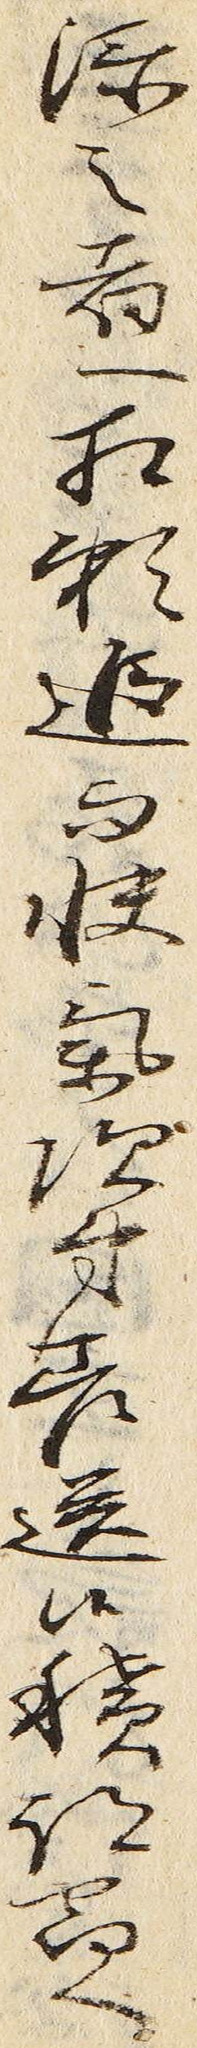添之者へ相頼追て快気次第差送候積跡宿へ
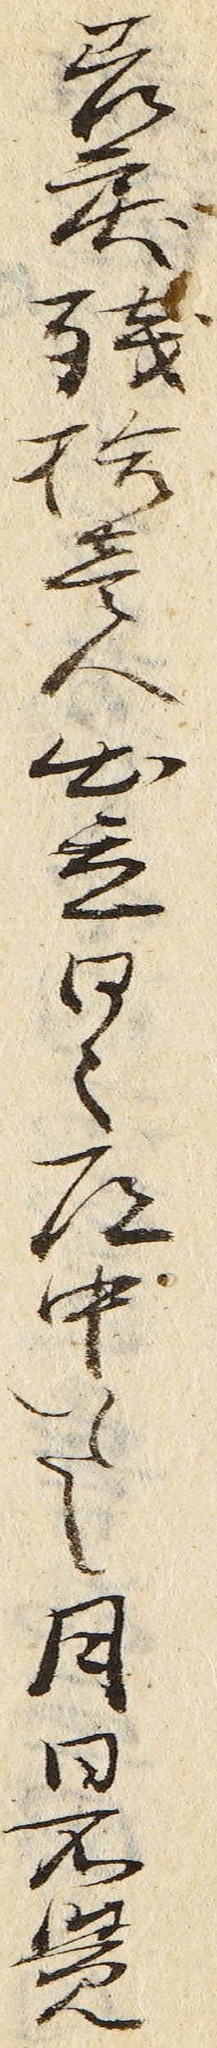差戻残拾壱人出立日々道中いたし月日不覚
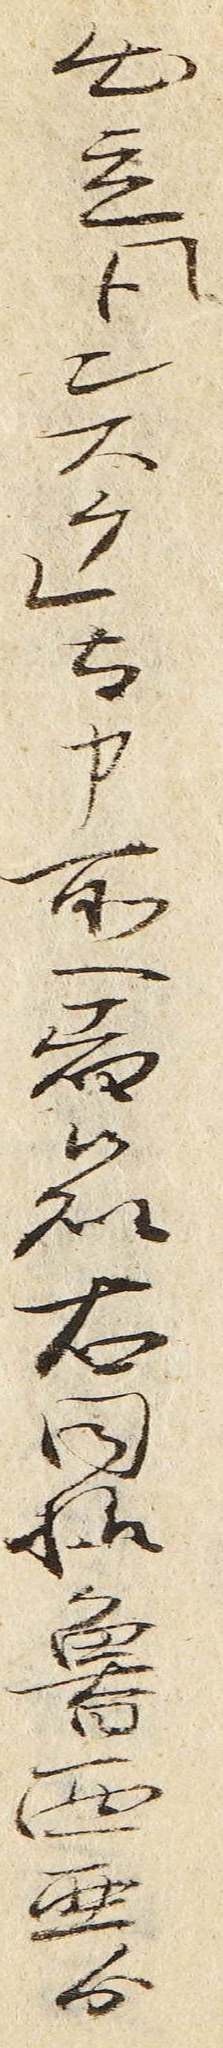出立「トンスケ」と申所へ着候処右同様魯西亜ゟ
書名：漂民後記
